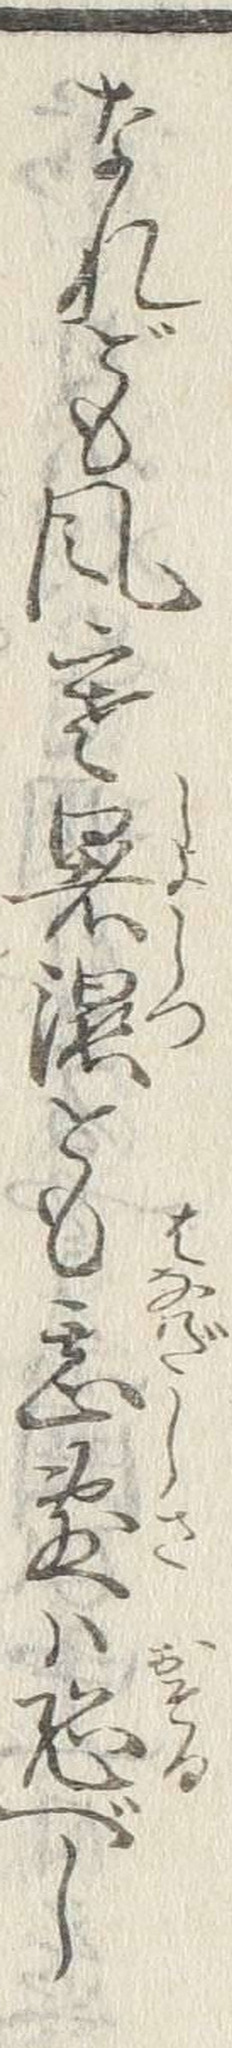なれども風寒暑湿とも甚敷は恐べし
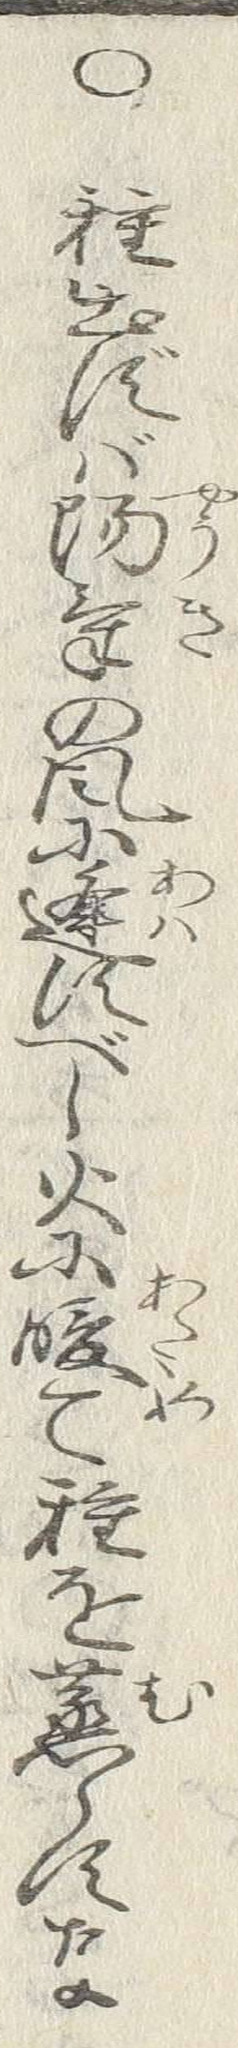○種出ずば陽氣の風に逢すべし火に暖て種を蒸らすな
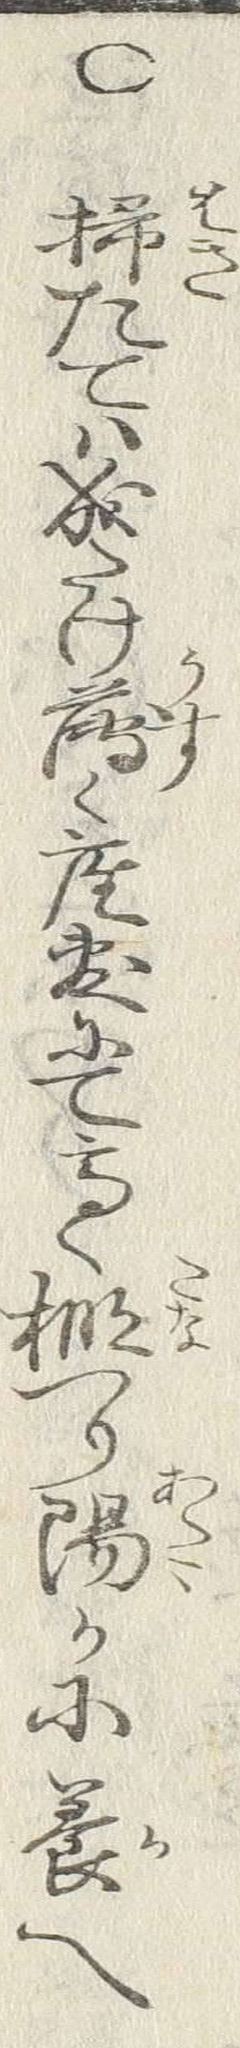○掃たては成たけ薄く座敷にて高く棚つり陽かに養へ
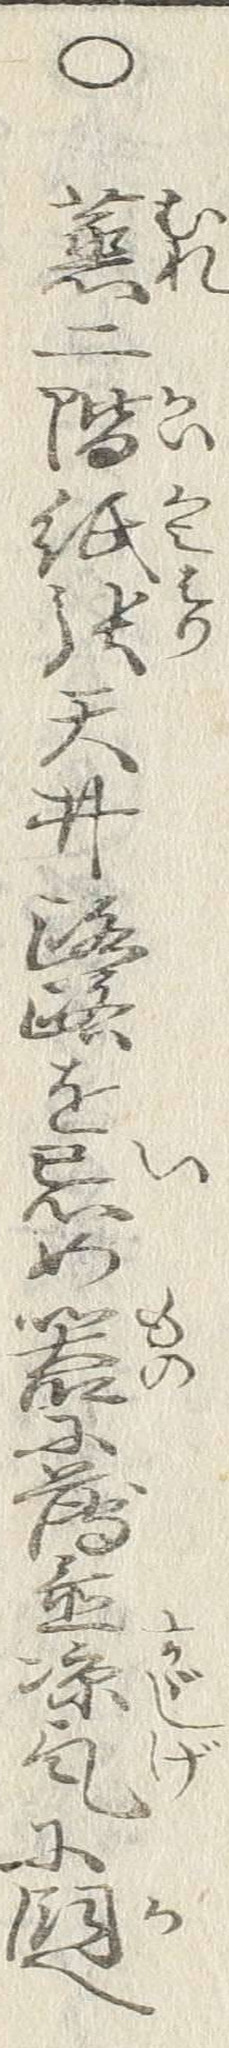○蒸二階紙張天井路路を忌め器に薄置涼氣に飼へ
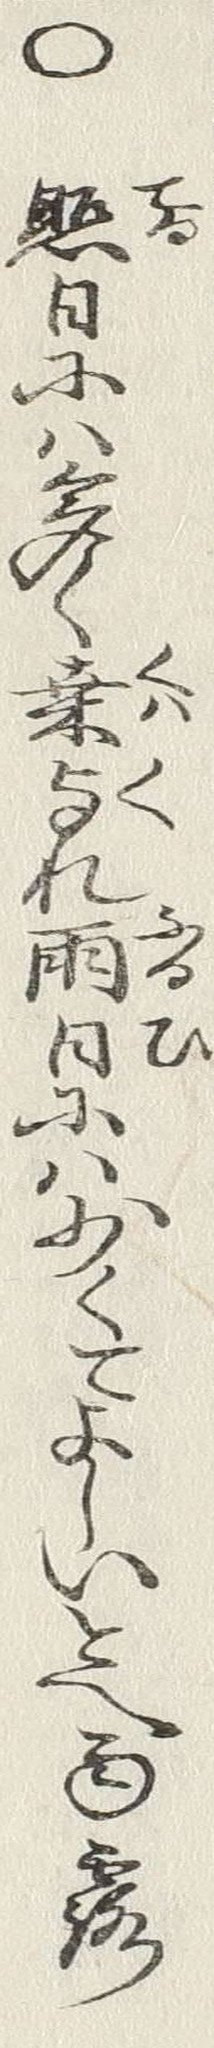○照日には多く桑与れ雨日には少くてよしいとへ雨露
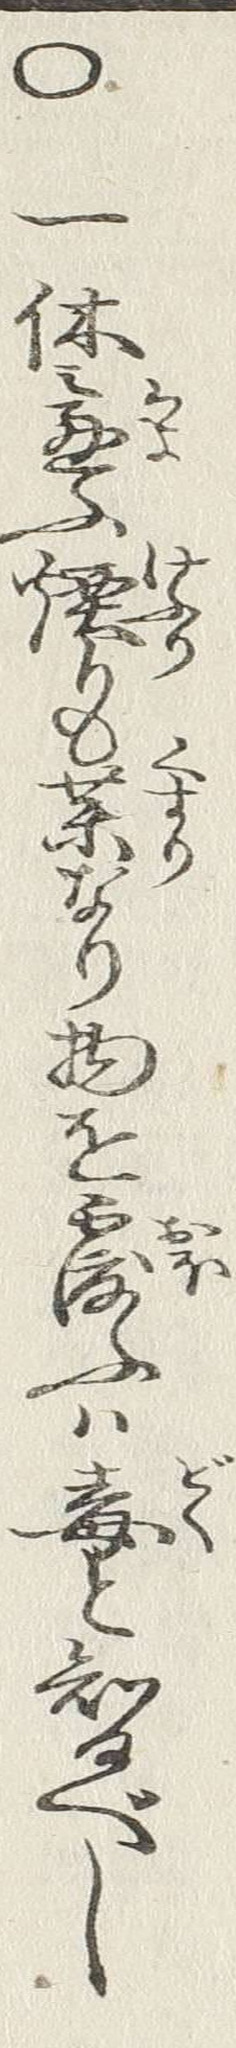○一休み通ふ煙りも薬なり物を覆ふは毒と知るべし
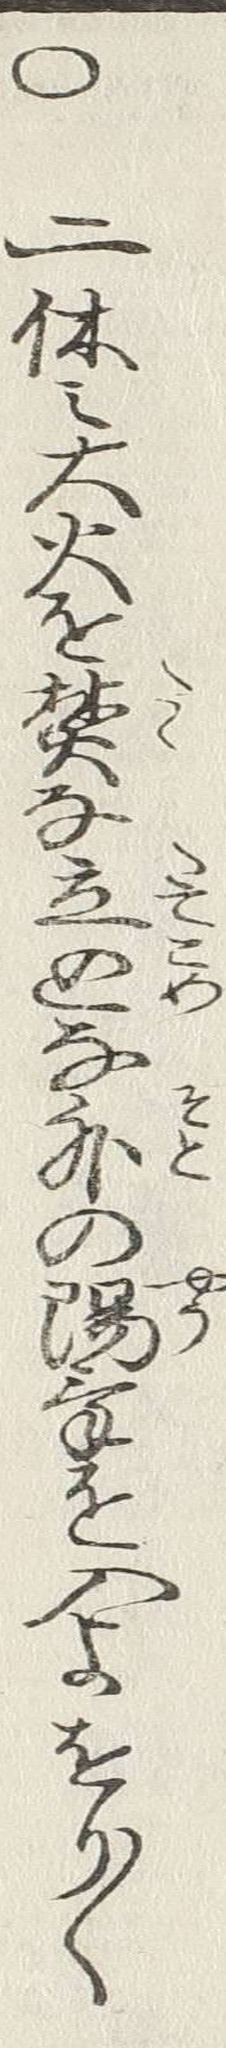○二休み大火を焚な立込な外の陽氣を入よをり〳〵
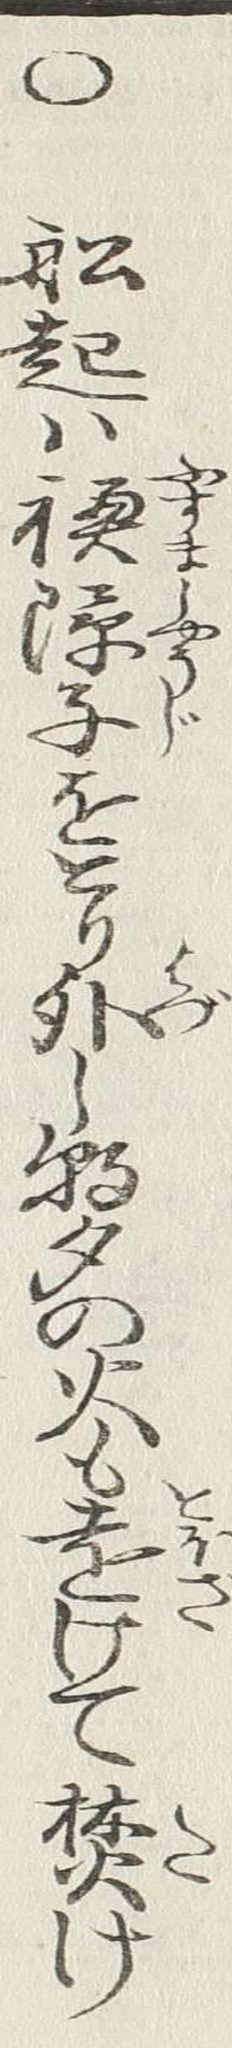○舩起は襖障子をとり外し朝夕の火も遠けて焚け
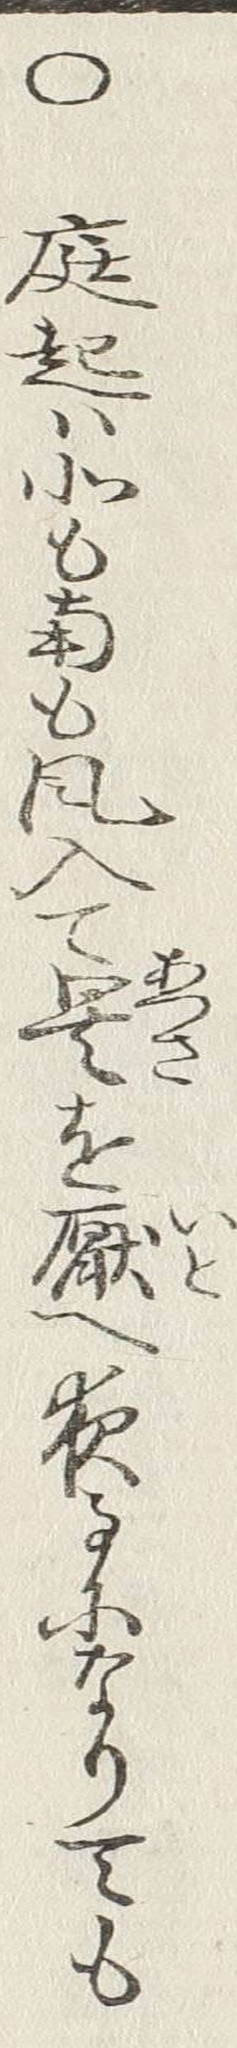○庭起は北も南も風入て暑を厭へ夜るになりても
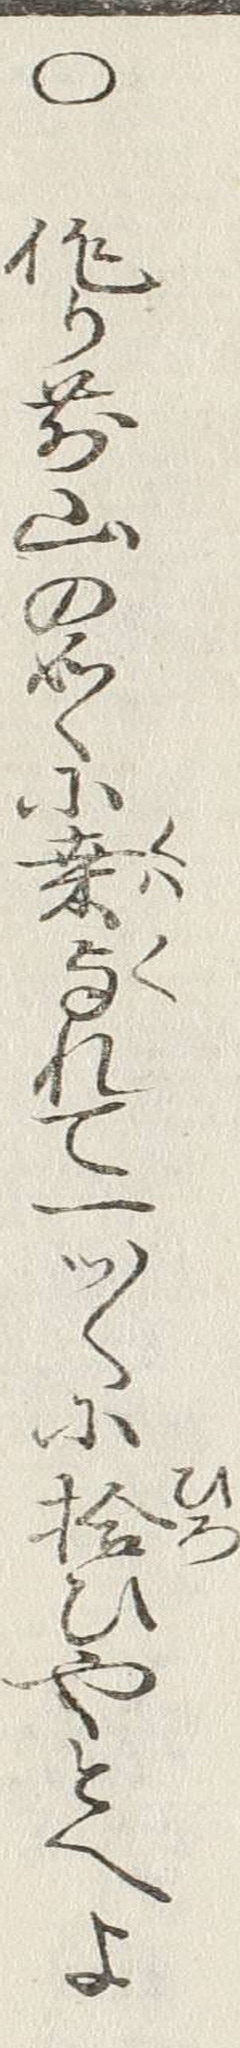○作り前山の如くに桑与れて一ッ〳〵に拾ひやとへよ
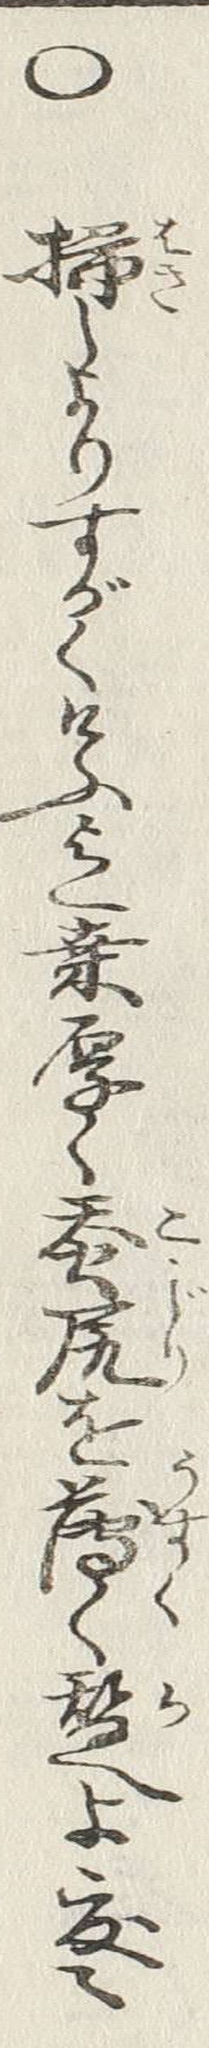○掃しよりすがくけふ迄桑厚く蚕尻を薄く替へよ度々
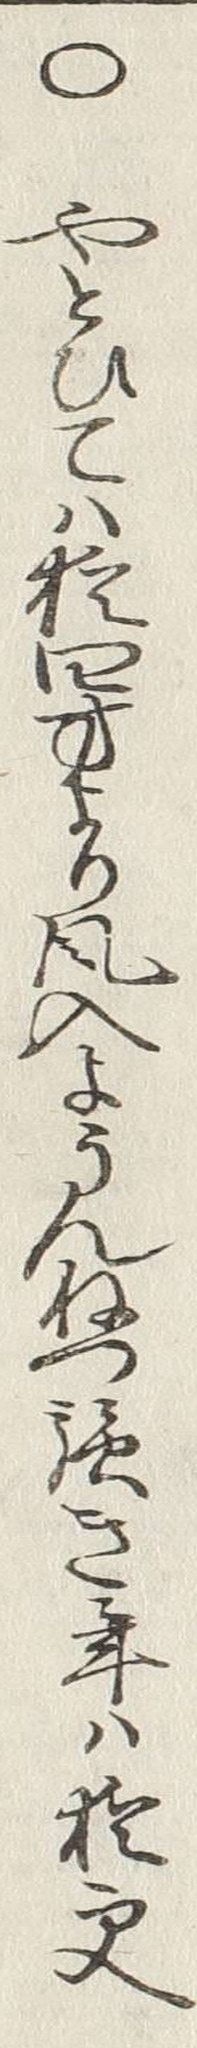○やとひては猶四方より風入ようんねつ強き年は猶更
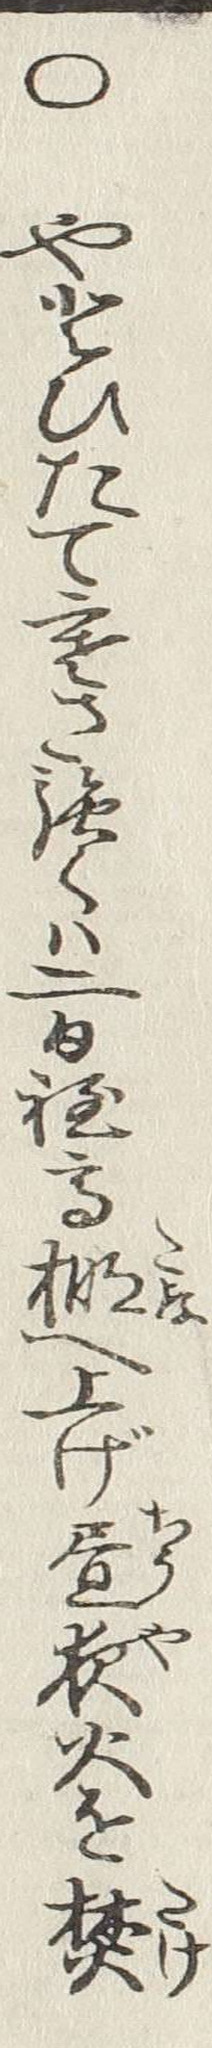○やとひたて寒さ強くは二日程高棚へ上げ昼夜火を焚

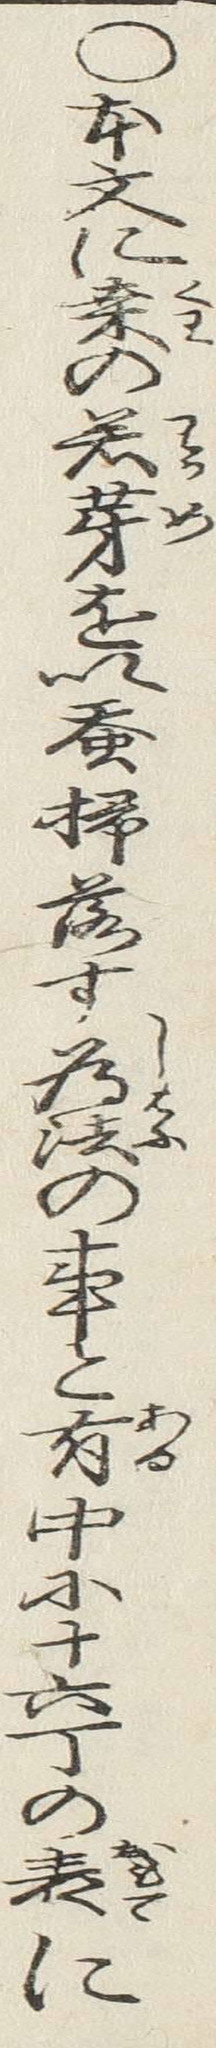○本文に桑の若芽を以蚕掃落す為法の事と有中に十六丁の表に
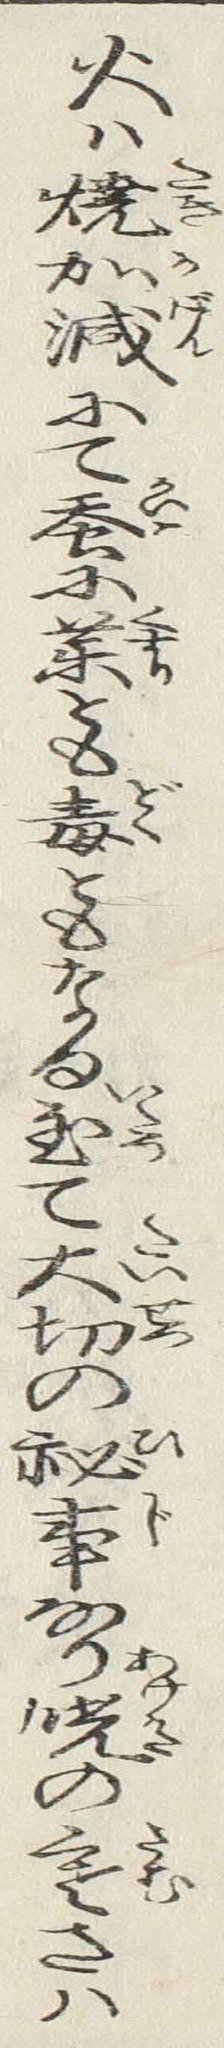火は焼加減にて蚕に薬とも毒ともなる至て大切の秘事なり暁の寒さは
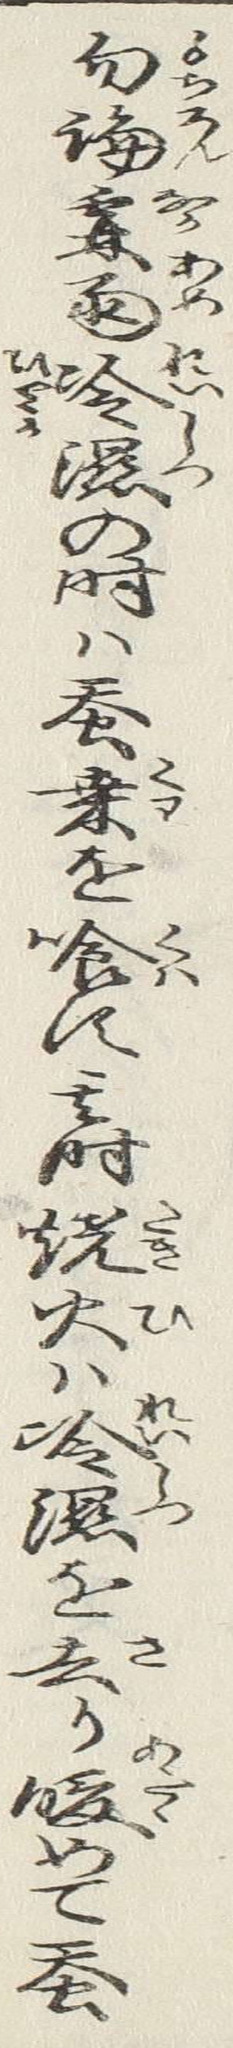勿論霖雨冷湿の時は蚕桑を喰す其時焼火は冷湿を去り暖めて蚕
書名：養蠶實驗録
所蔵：東京大学農学生命科学図書館 国文学研究資料館
